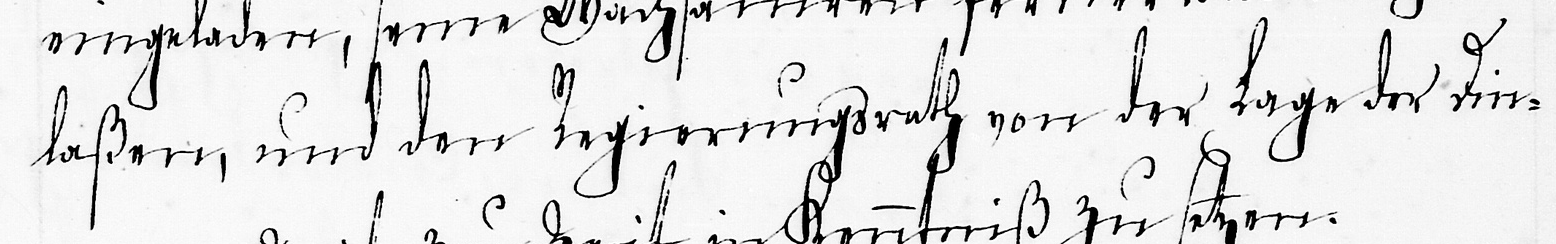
laßen, und den Regierungsrath von der Lage der Din¬
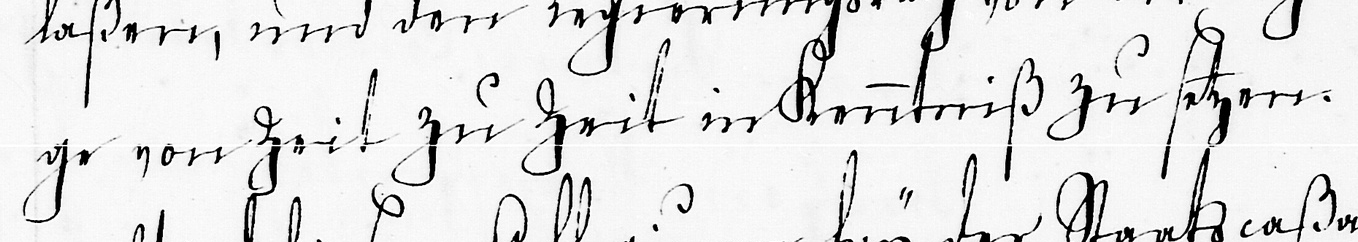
ge von Zeit zu Zeit in Kenntniß zu setzen.
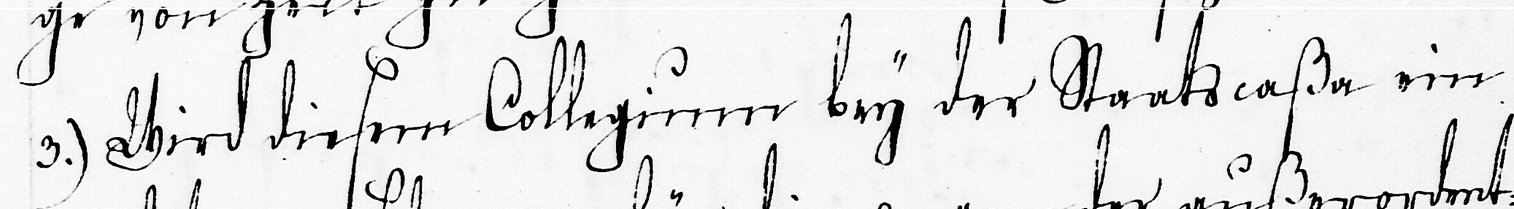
3.) Wird diesem Collegium bey der Staatscaßa ein
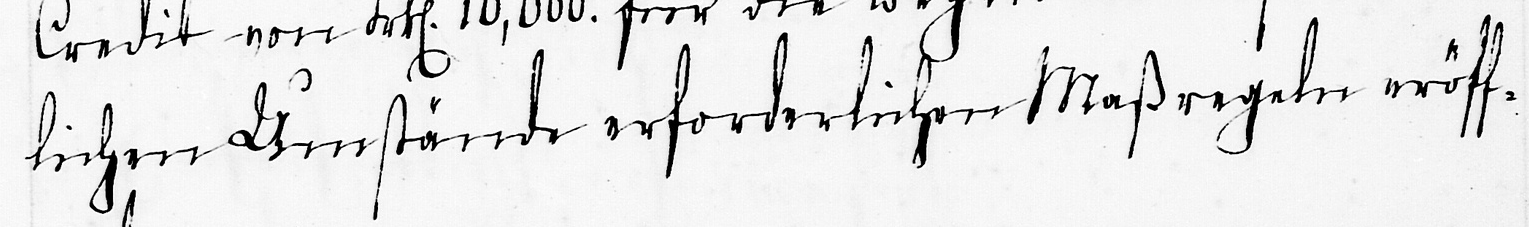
lichen Umstände erforderlichen Maßregeln eröff¬
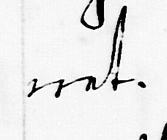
net.
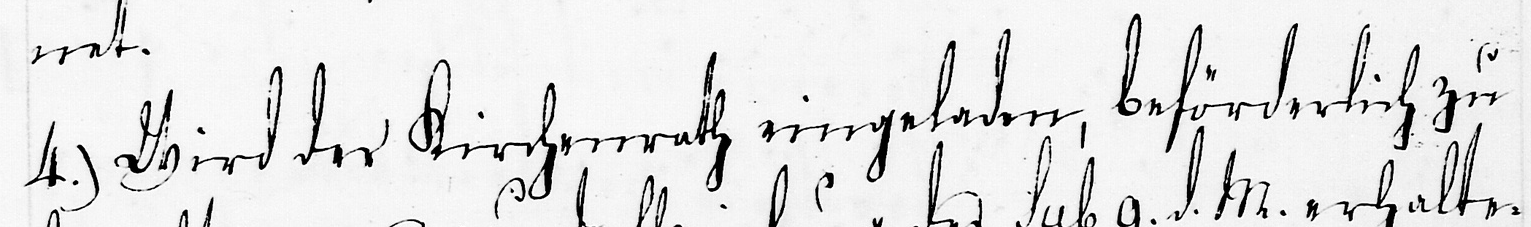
4.) Wird der Kirchenrath eingeladen, beförderlich zu
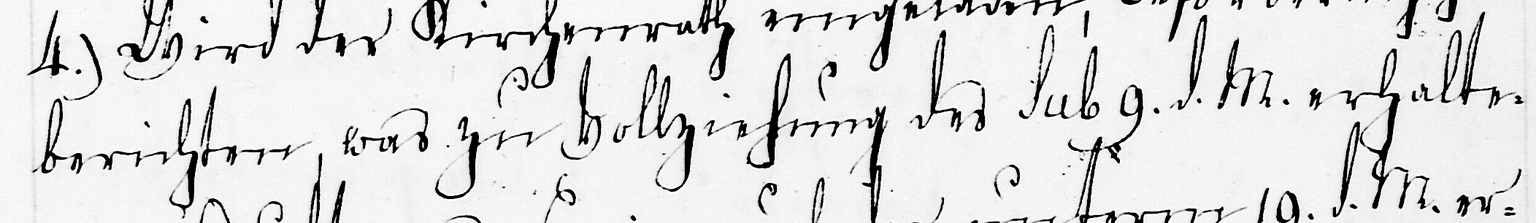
berichten, was zu Vollziehung des sub 9. d. M. erhalte¬
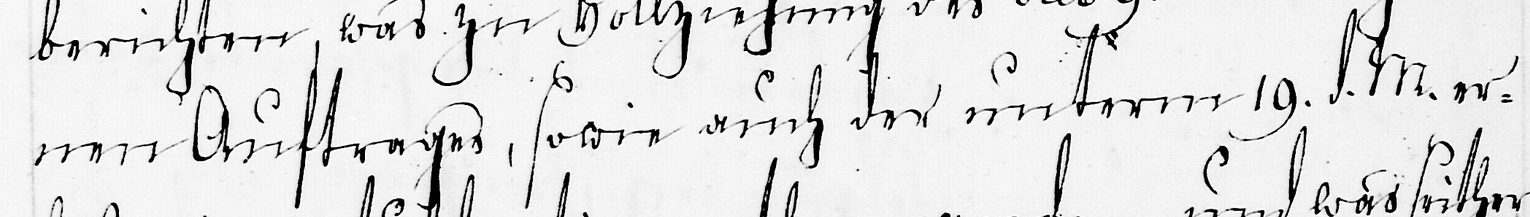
nen Auftrages, sowie auch der unterm 19. d. M. er¬
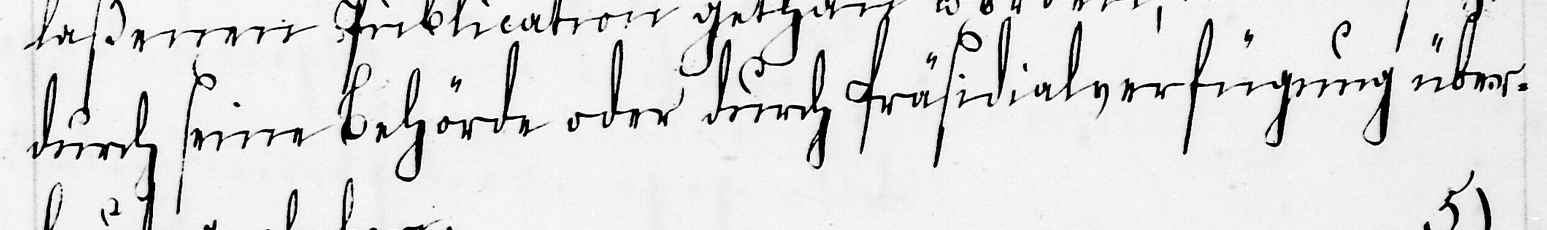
durch seine Behörde oder durch Präsidialverfügung über¬
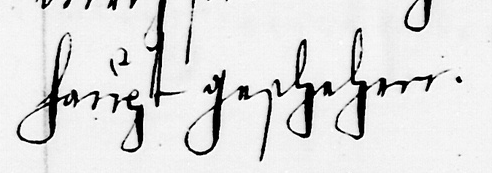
haupt geschehen.
